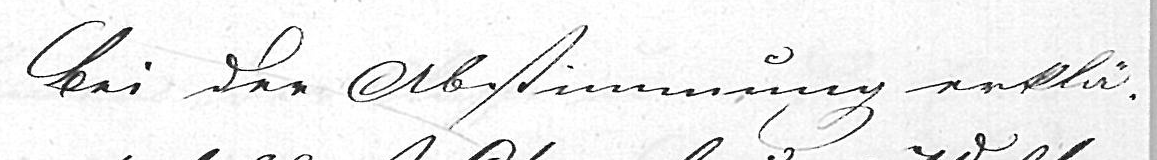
Bei der Abstimmung erklär-
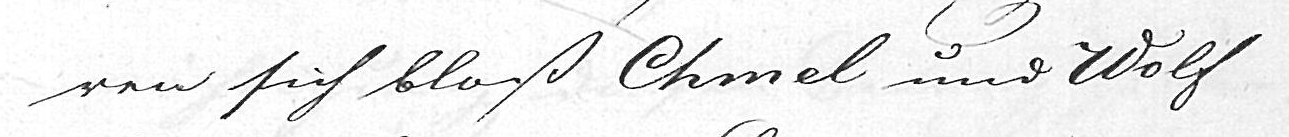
ren sich bloß Chmel und Wolf
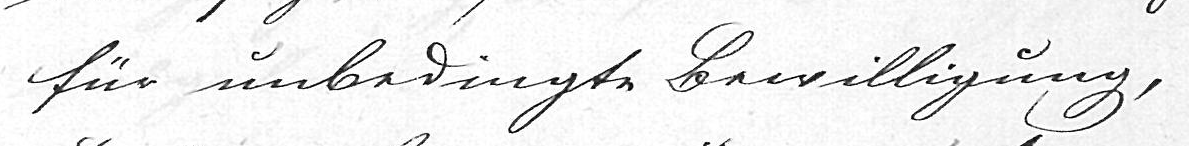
für unbedingte Bewilligung,
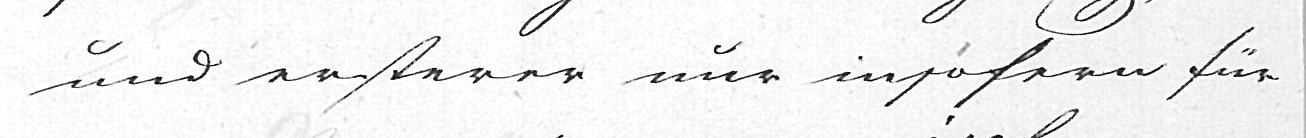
und ersterer nur imsofern für
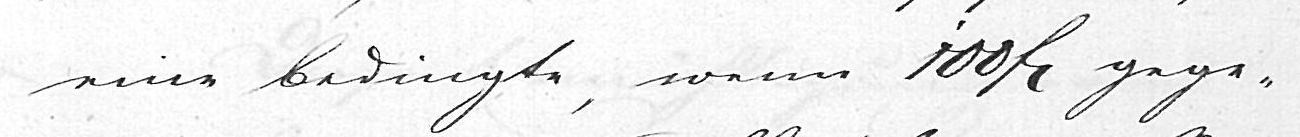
eine bedingte, wenn 100 fl gege-
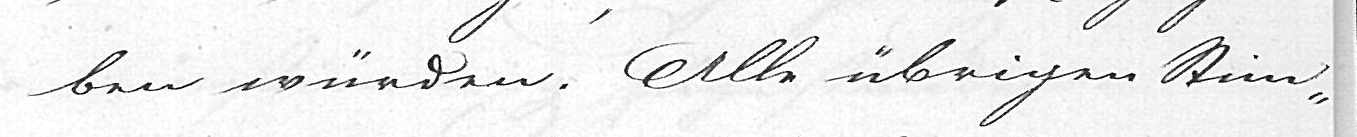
ben würden. Alle übrigen Stim-
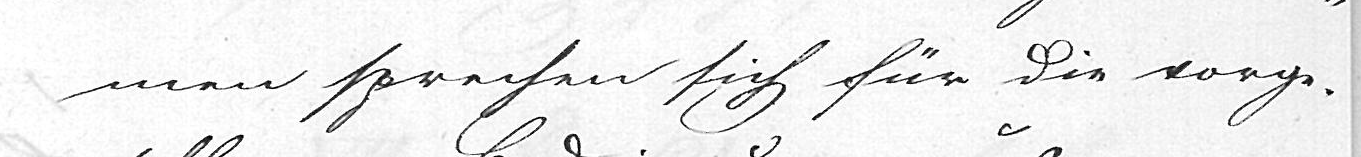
men sprechen sich für die vorge-
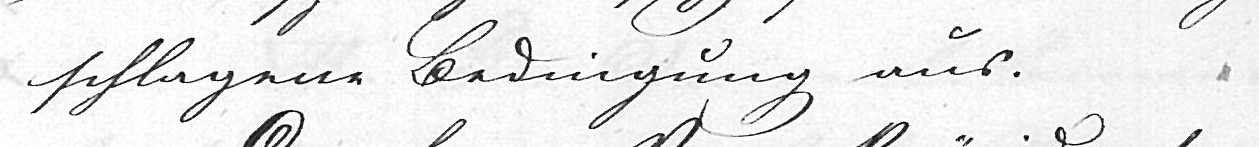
schlagene Bedingung aus.
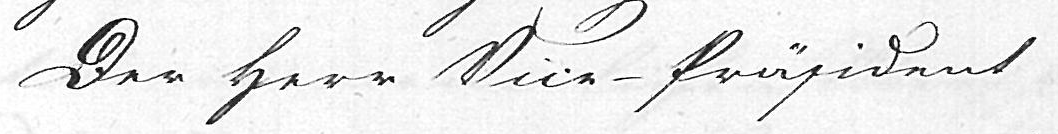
Der Herr Vice-Präsident
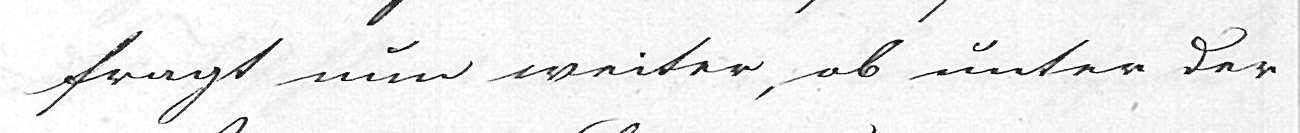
fragt nun weiter, ob unter der
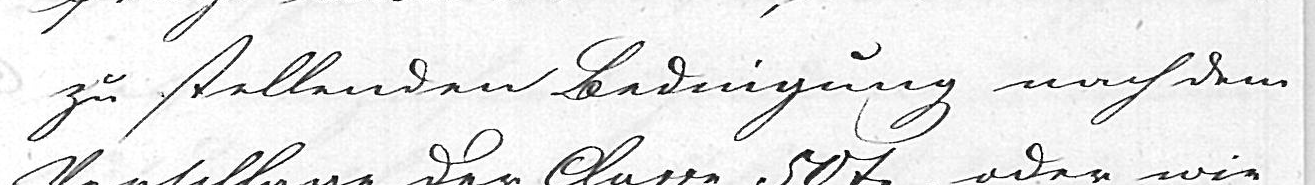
zu stellenden Bedingung nach dem
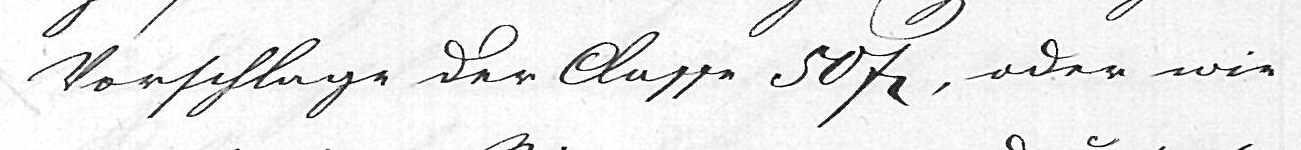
Vorschlage der Classe 50 fr, oder wie
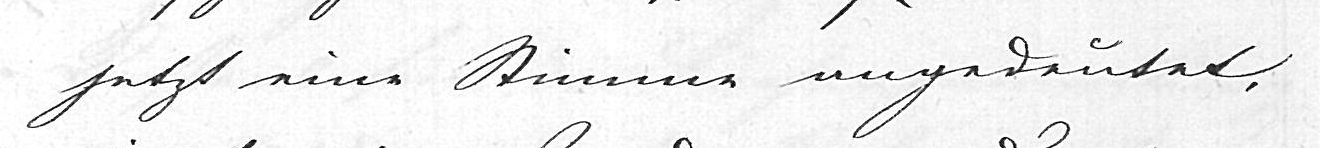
jetzt eine Stimme angedeutet,
